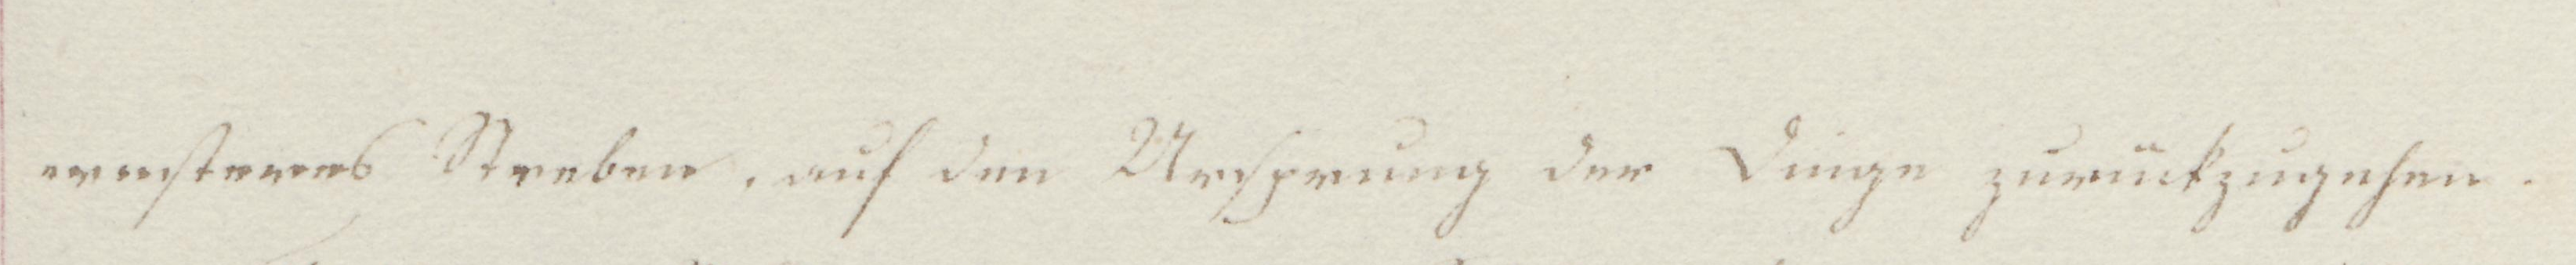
ernsteres Streben, auf den Ursprung der Dinge zurückzugehen.
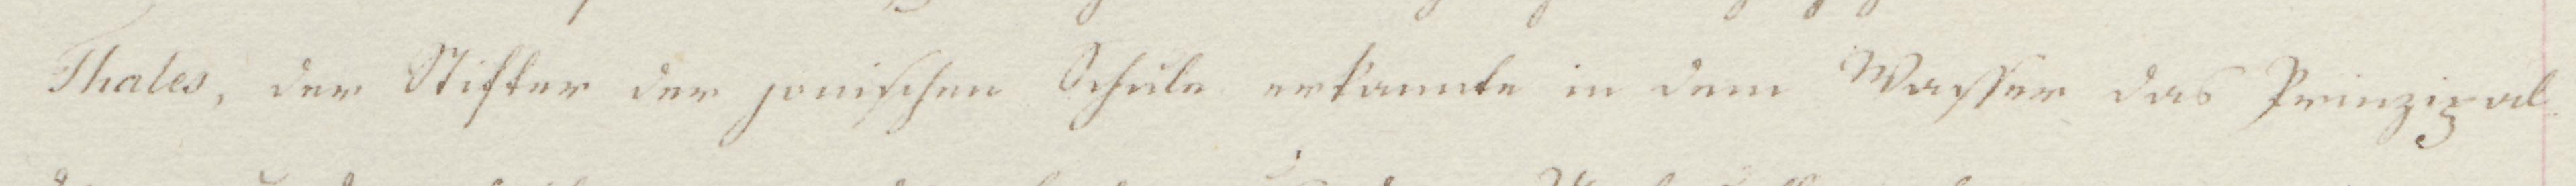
Thales, der Stifter der jonischen Schule erkannte in dem Wasser das Prinzip al-
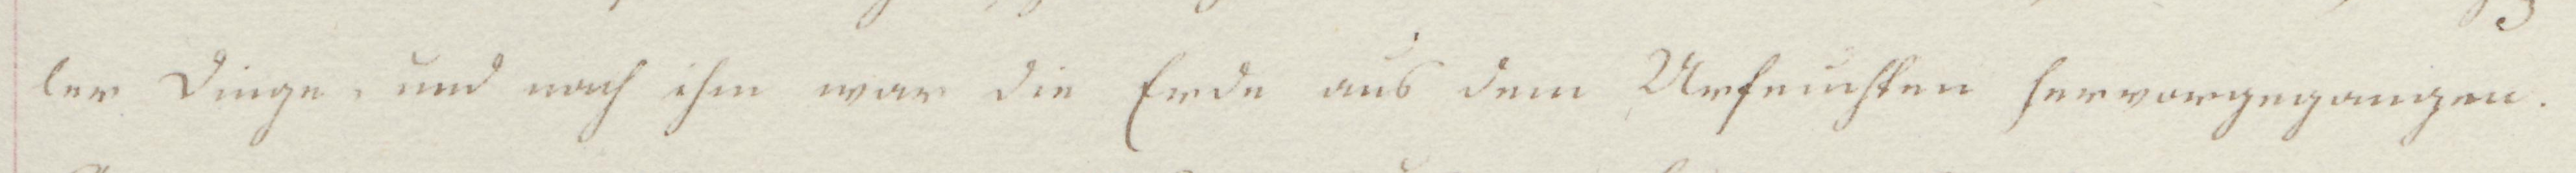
ler Dinge, und nach ihm war die Erde aus dem Urfeuchten hervorgegangen.
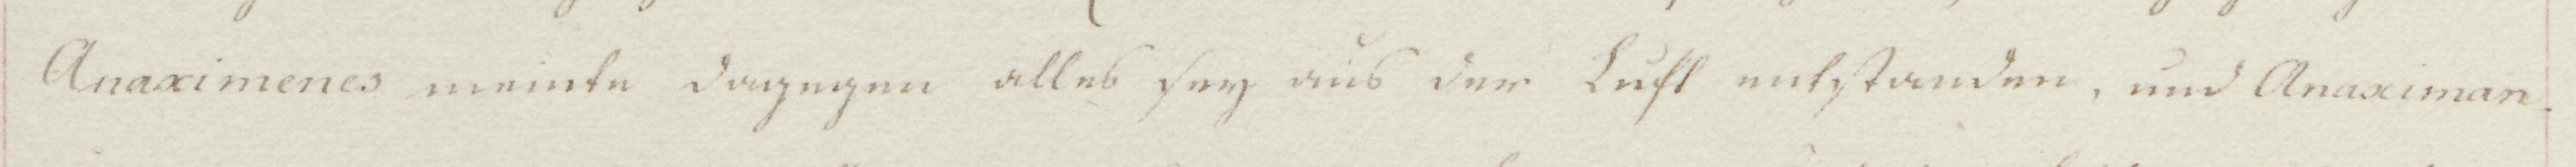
Anaximenes meinte dagegen alles sey aus der Luft entstanden, und Anaximan-
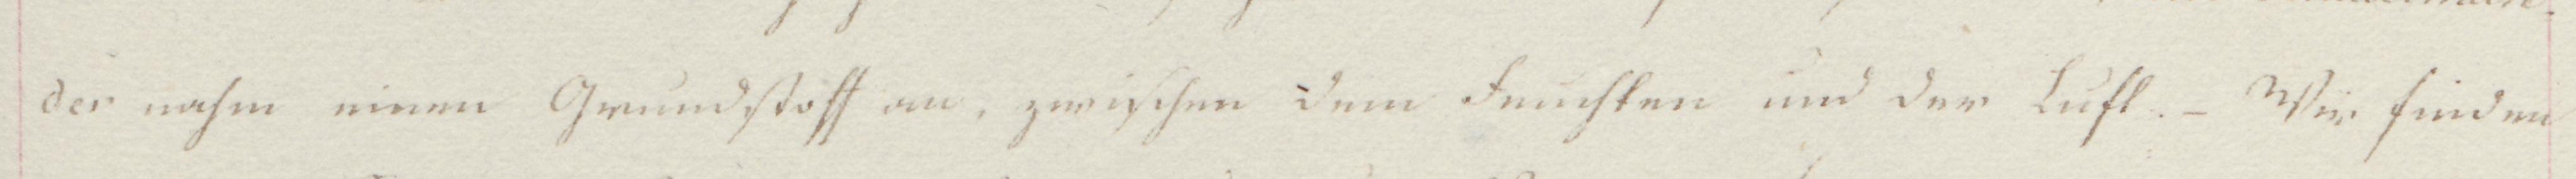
der nahm einen Grundstoff an, zwischen dem Feuchten und der Luft. – Wir finden
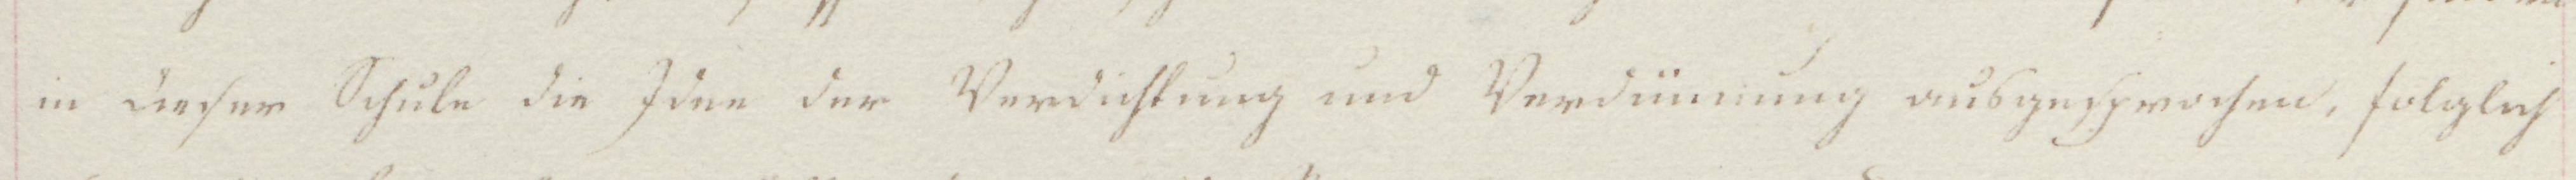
in dieser Schule die Idee der Verdichtung und Verdünnung ausgesprochen, folglich
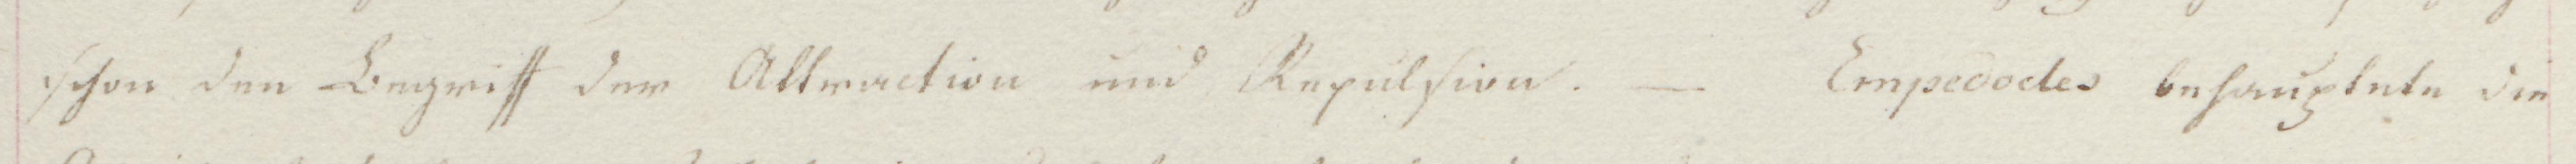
schon den Begriff der Attraction und Repulsion. – Empedocles behauptete die
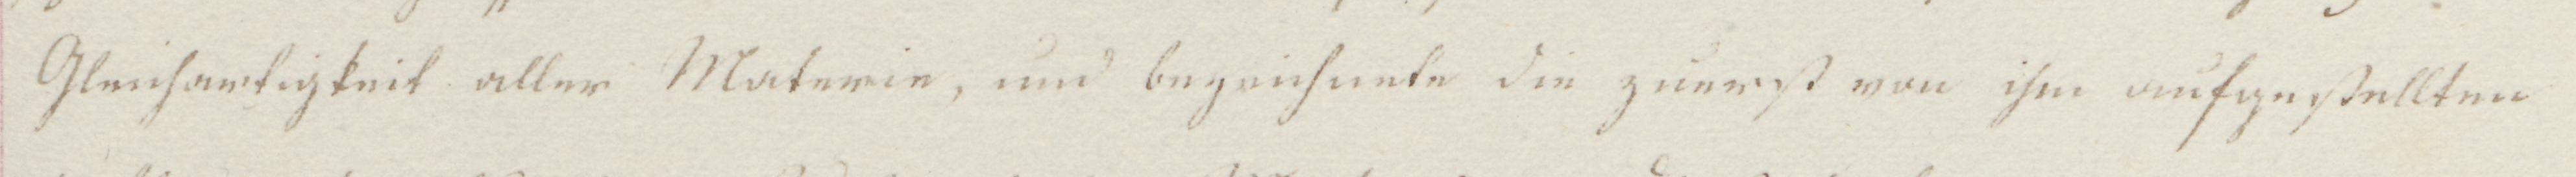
Gleichartigkeit aller Materie, und bezeichnete die zuerst von ihm aufgestellten
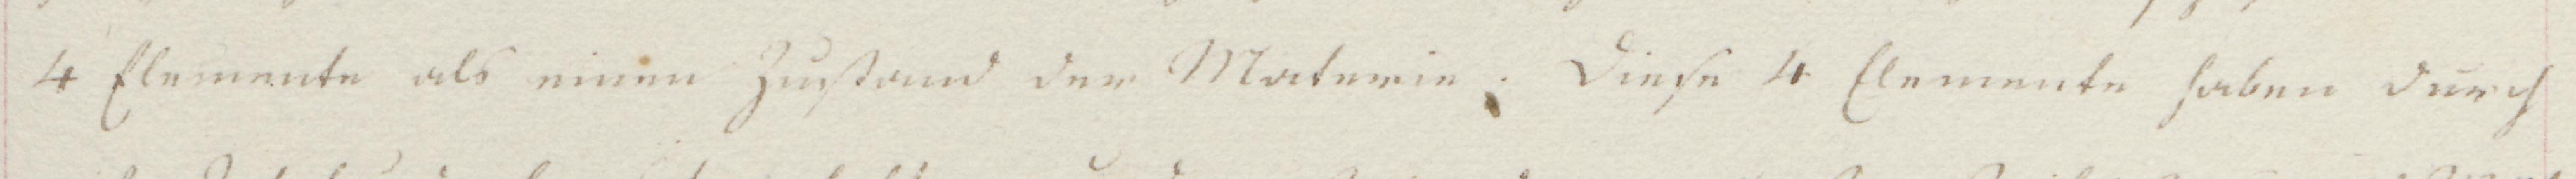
4 Elemente als einen Zustand der Materie. Diese 4 Elemente haben durch
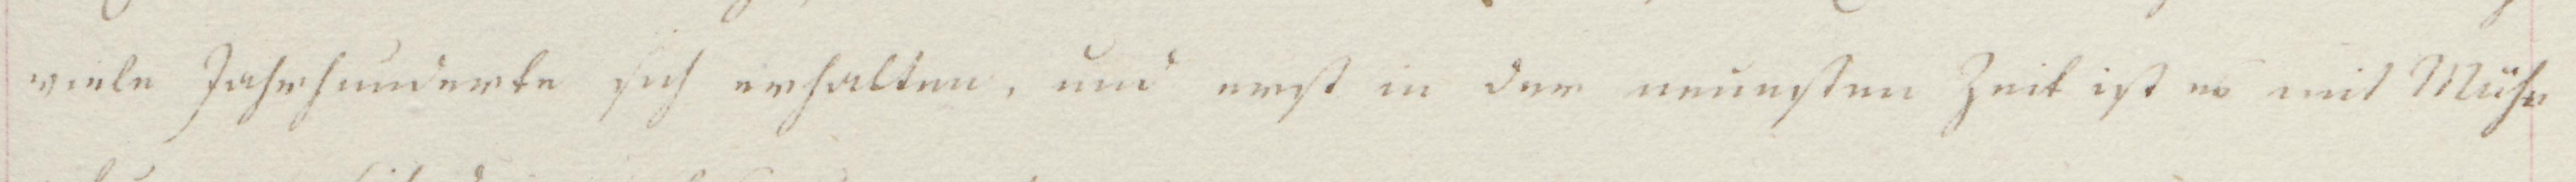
viele Jahrhunderte sich erhalten, und erst in der neuesten Zeit ist es mit Mühe
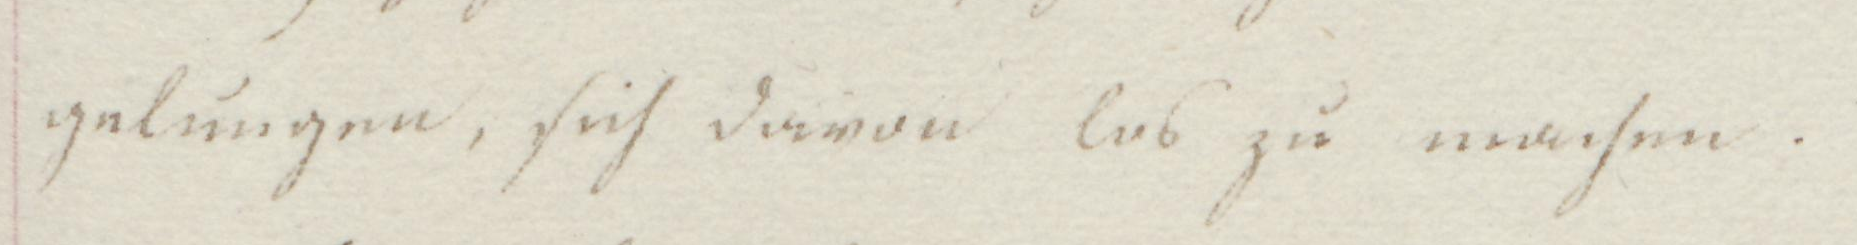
gelungen, sich davon los zu machen.
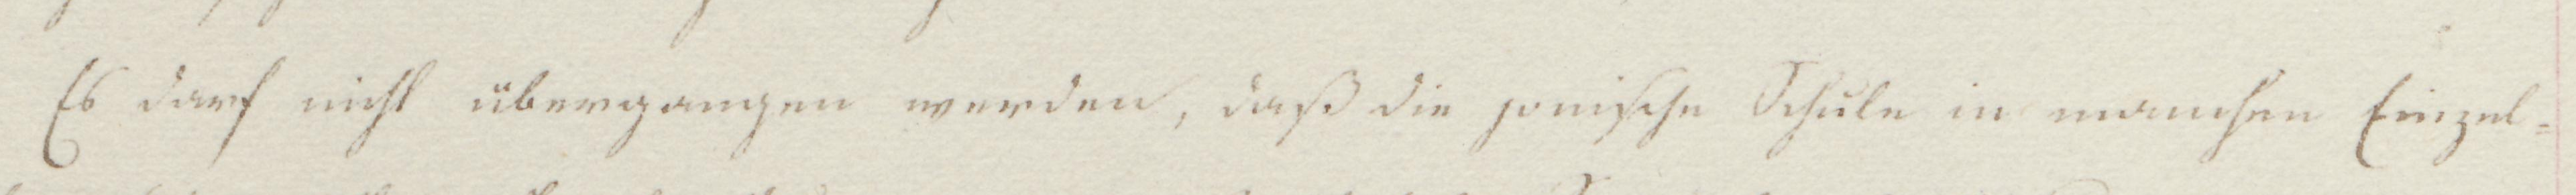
Es darf nicht übergangen werden, daß die jonische Schule in manchen Einzel-
